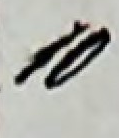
10
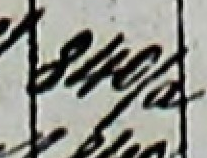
840/a
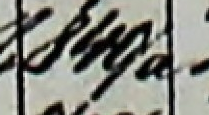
840/a
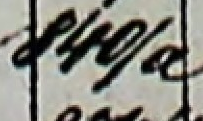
840/a
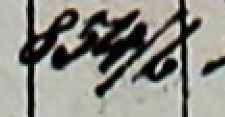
854/b
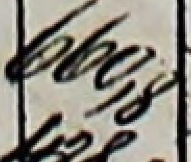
660,8
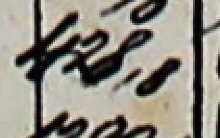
428,8
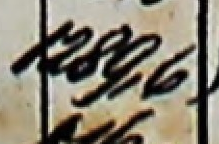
1289,6
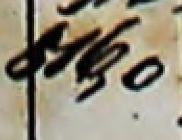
816,0
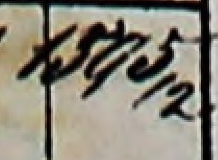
1595,2
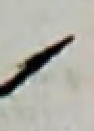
1
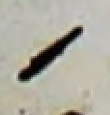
1
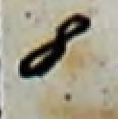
8
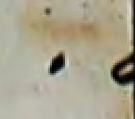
.
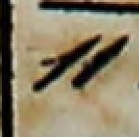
11
